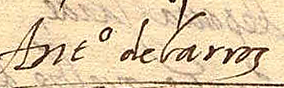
Anto de barros
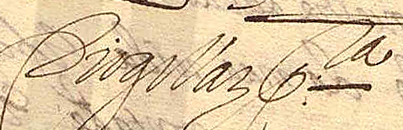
Diogo Vaz p.ra
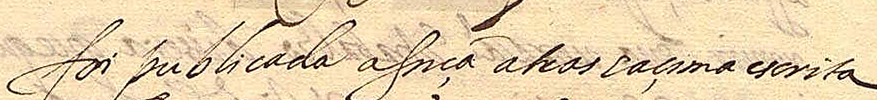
foi publicada a snçā atras e acima escrita
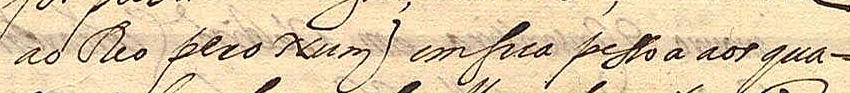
ao Reo pero Nunz̄ em sua pessoa aos qua
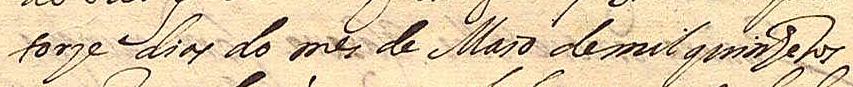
torze dias do mes de Maio de mil quinhētos
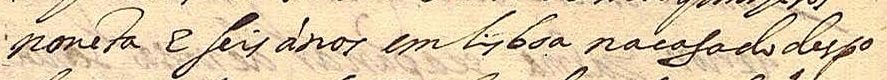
nouēta E seis ānos em lisboa na casa do despo
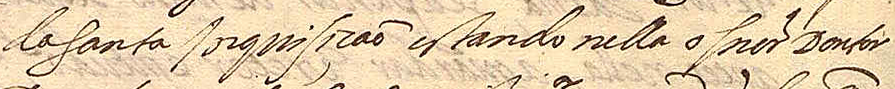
da santa Jnquisição estando nella o snor̄ Doutor
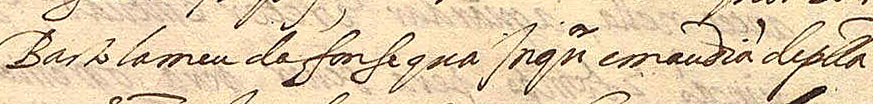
Bartolameu da fonsequa Jnquor em audiā de pl̄la
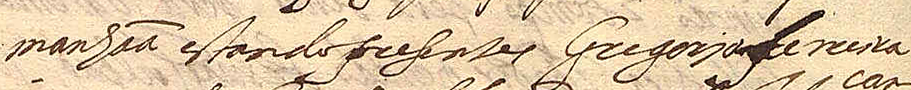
manhāa estando presentes Gregorjo ferreira
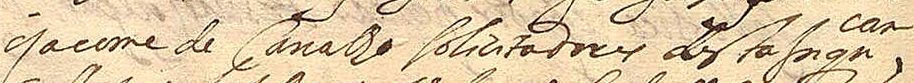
e Jacome de Caualho solicitadores desta Jnquçam
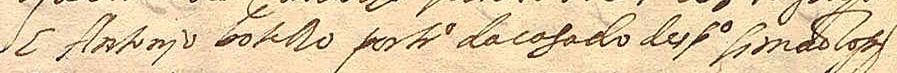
E Antonjo botelho portro da casa do despo simaõ lopz̄
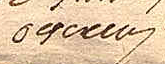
o escreuj
